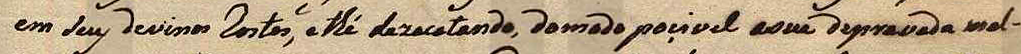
em seus devinos Rostos, e thé dezecatando, do modo pocivel a sua depravada mal
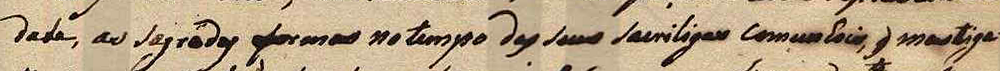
dade, as sagradas formas no tempo das suas Sacriligas comunhois, q̄ mastiga
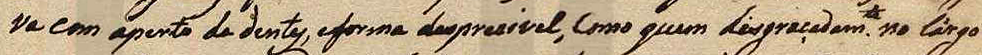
va com aperto de dentes, e forma despresivel, Como quem desgraçadam.te no largo
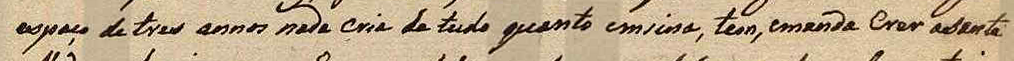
espaço de tres annos nada cria de tudo quanto emsina, tem, e manda Crer a santa
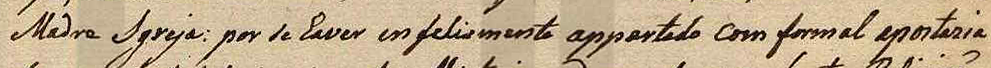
Madre Igreja: por se haver infelismente appartado com formal apostazia
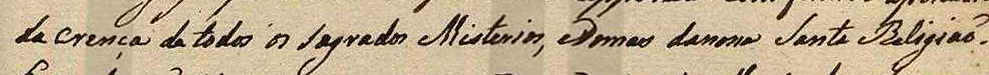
da crença de todos os sagrados Misterios, e domas da nossa Santa Religiaõ.
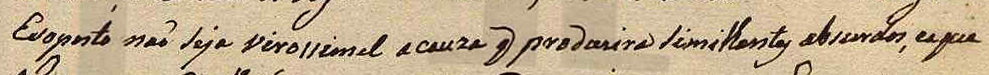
E soposto naõ seja verossimel a cauza q̄ produzira similhantes absurdos, e a que
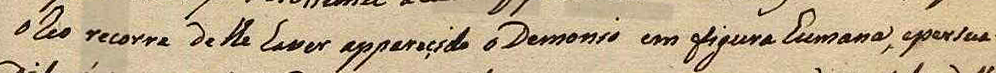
o Reo recorre de lhe haver apparecido o Demonio em figura humana, e persua
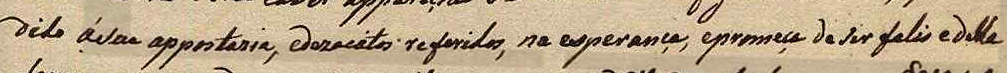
dido a sua appostasia, e dezacatos referidos, na esperança, e promeça de ser felis e delle
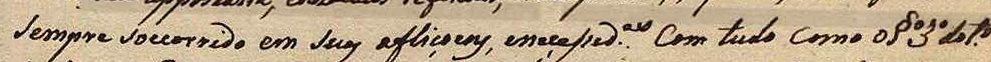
sempre soccorrido em suas afliçoens, e necessed.es Comtudo como o §o 3.o do t.o
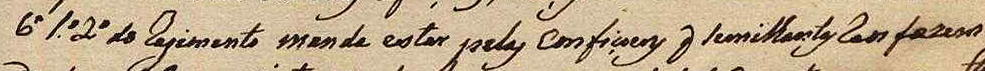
6o 1.o 2.o do Regimento manda estar pelas confiçoens q̄ semilhantes Reos fazem
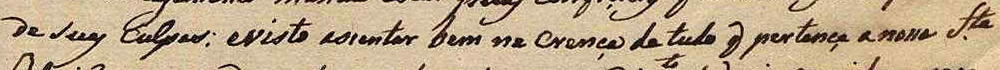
de suas culpas: e visto assentar bem na crença de tudo q̄ pertença a nossa S.ta
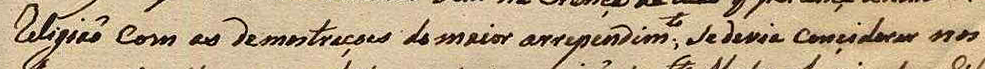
Religiaõ com as demostraçoes do maior arrependim.to; se devia conciderar nos
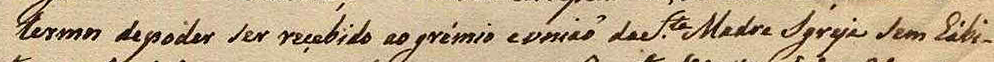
termos de poder ser recebido ao grémio e vniaõ da S.ta Madre Igreja sem habi
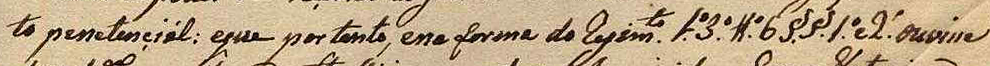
to penetencial: e que portanto, e na forma do Regim.to l.o 3.o tt.o 6 §.§. 1.o e 2.o ouvisse
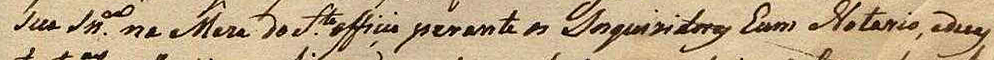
sua sn.a na Meza do S.to officio perante os Inquizidores hum Notario, e duas
